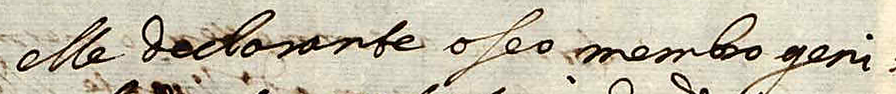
elle declarante o seo membro geni
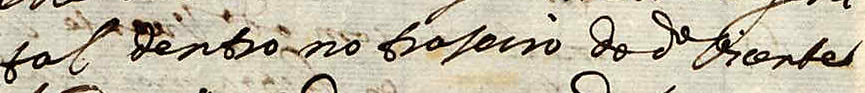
tal dentro no traseiro do d.to vicente
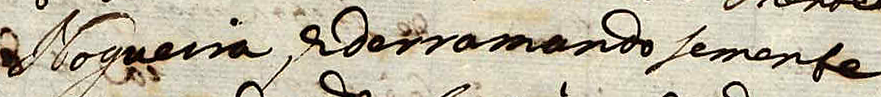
Nogueira, e derramando semente
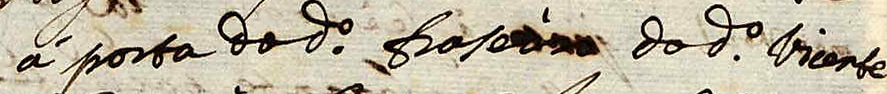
á porta do d.to traseiro do d.to vicente
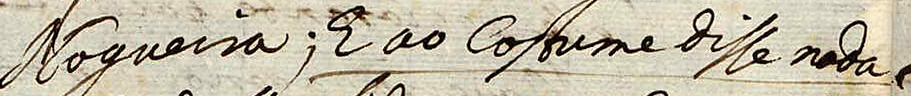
Nogueira; e ao costume disse nada
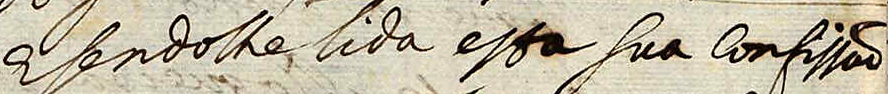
e sendolhe lida esta sua confissaõ
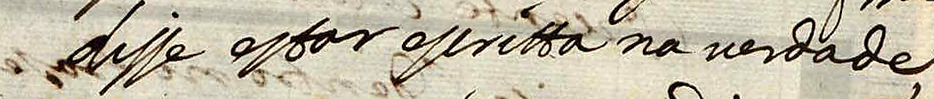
disse estar escritta na verdade,
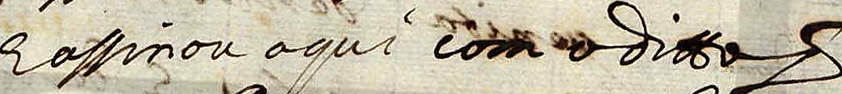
e assinou aqui com o ditto S.r
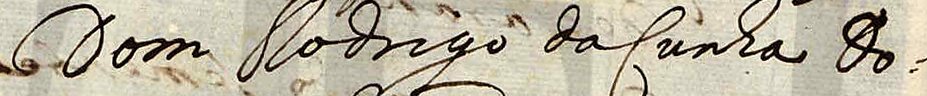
Dom Rodrigo da Cunha do
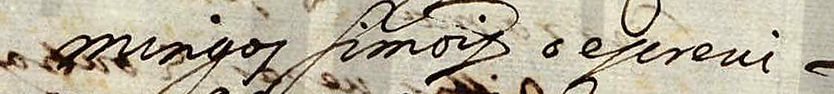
mingos Simõis o escrevi
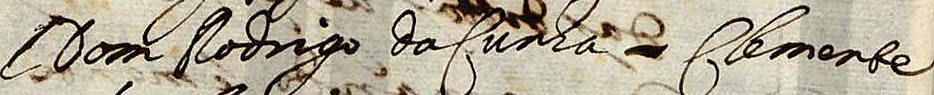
Dom Rodrigo da Cunha Clemente
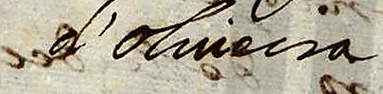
d'oliueira
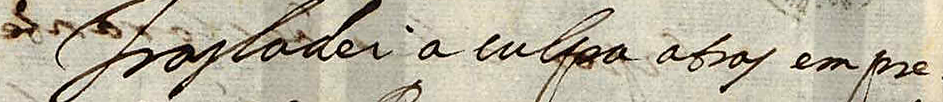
Trasladei a culpa atras em pre
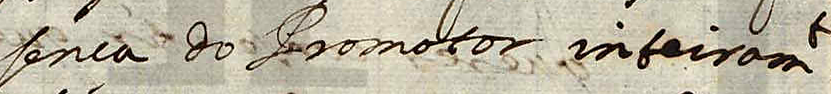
sença do Promotor inteiramen.te
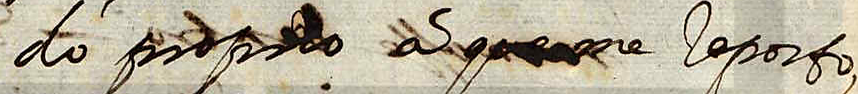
do próprio ao que me reporto,
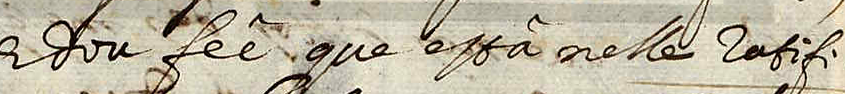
e dou feê que está nelle ratifi
